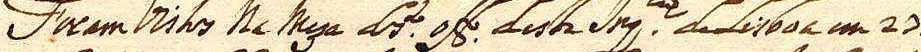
Foram Vistos Na Meza do sto. offo. desta Inq.caõ de Lisboa em 27.
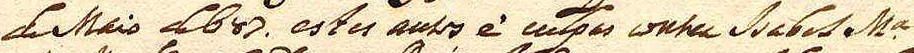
de Maio de 687. estes autos, e culpas contra Isabel M.a
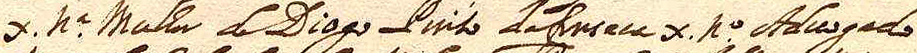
x. n.a Mulher de Diogo Pinto da fonseca x. n.o Aduogado
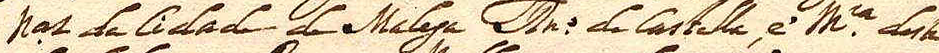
n.al da Cidade de Malega Rn.o de Castella, e M.ra desta
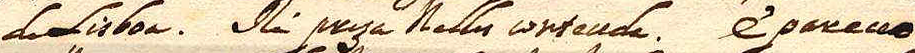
de Lisboa. Ré preza Nelles conteuda. E pareceo
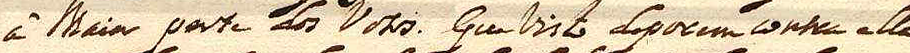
à Maior parte dos Votos. Que Visto deporem contra ella
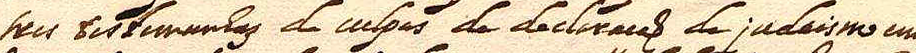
tres testemunhaz de culpas de declaraçaõ de judaismo em
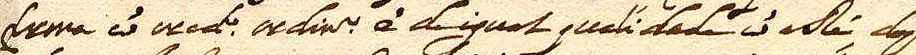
forma cō credo. ordino. e de igual qualidade cō a Ré, de q̄
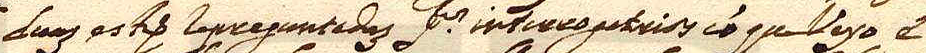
duaz estaõ Repreguntadaz p.los interrogatorios cō que Veyo, e
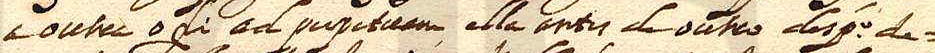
a outra o foi ad perpetuam, ella antes de outro desp.o de
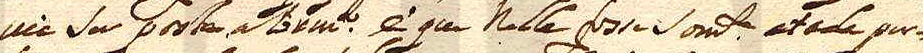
uia ser posta a tormto. e que Nella fosse Som.te atada per
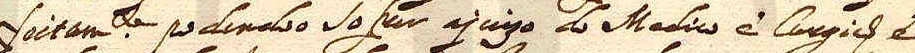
feitam.te podendoo sofrer a juizo do Medico e Curgiaõ e
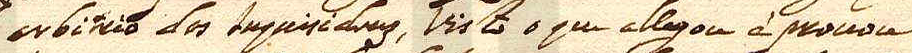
arbitrio dos Inquisidorez, Visto o que allegou e prouou
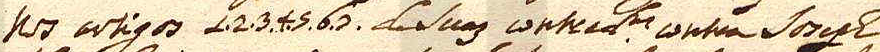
Nos artigos 1. 2. 3. 4. 5. 6. 7. de suaz contrad.as contra Iozeph
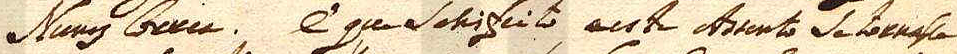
Nunez Correa. E que satisfeito a este Assento se tornasse
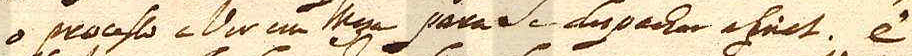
o processo a Ver em Meza para se despachar afinal. e
